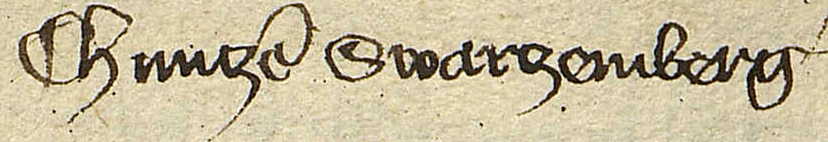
Chuncʒe* Swarcʒemberg*
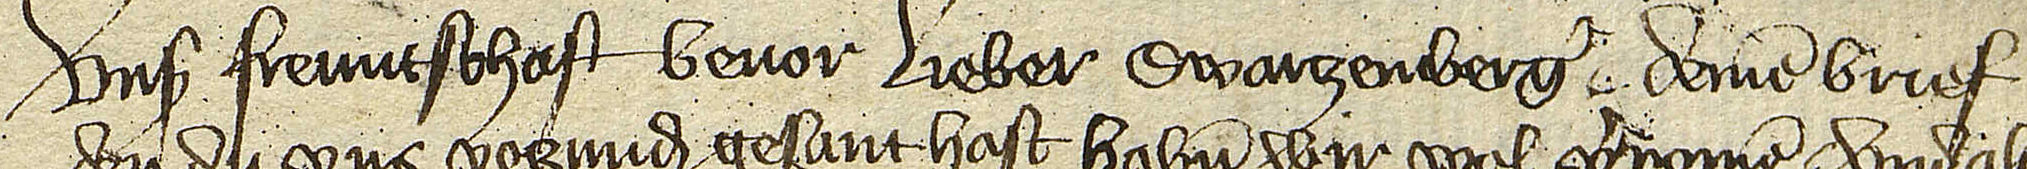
Vnſ* freuntſchaft beuor Lieber Swarcʒemberg* / deine* brief
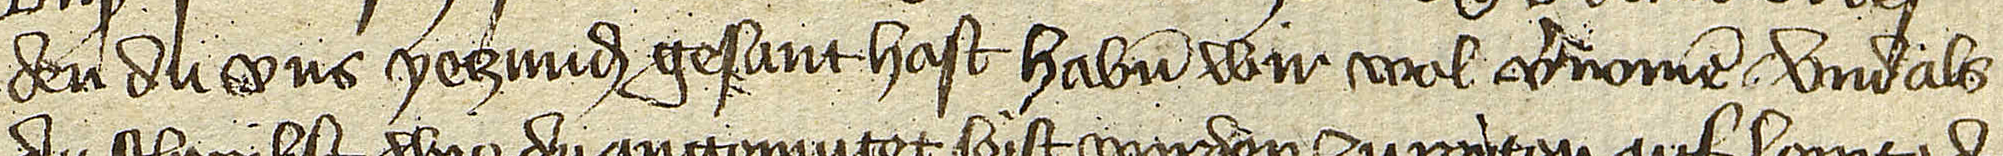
den du vns yecʒund* geſant haſt habn* wir wol v*nome* / vnd als
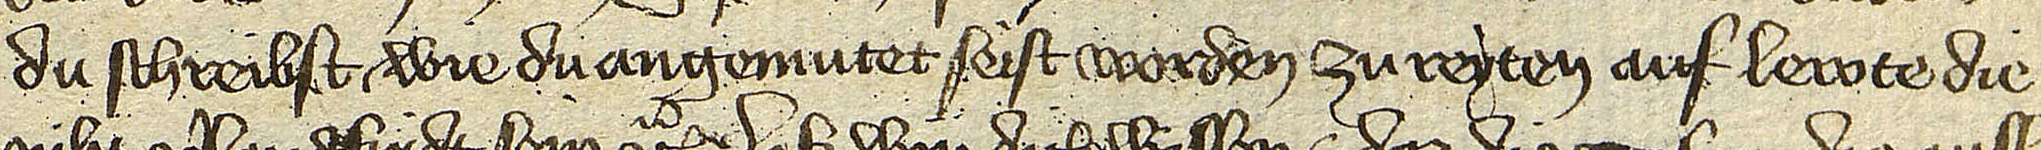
du ſchreibſt / wie du angemutet ſeiſt worden cʒu reyten auf lewte die
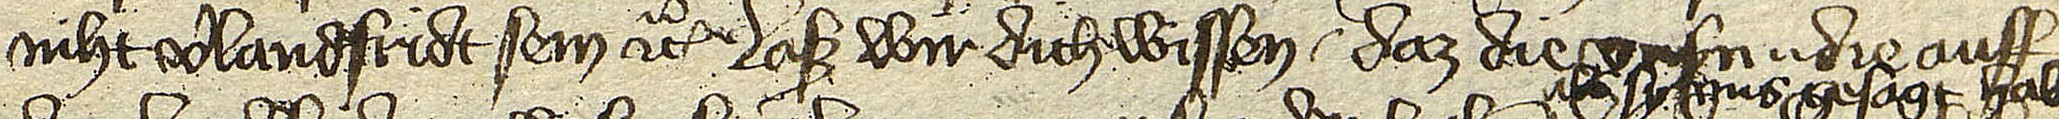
niht v*landfridt ſein ec* Laſʒ wir dich wiſſen / daʒ die vnſ*n ~ die auff
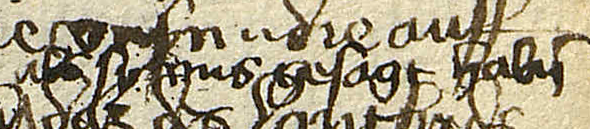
als ſy uns geſagt habn*
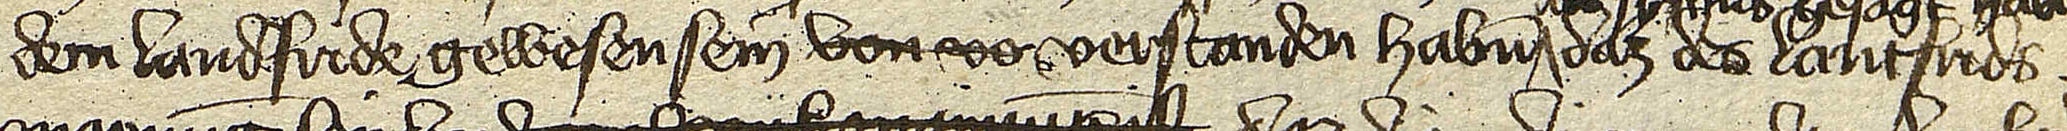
dem landfride geweſen ſein von vo verſtanden habn* daʒ des lantfrids .
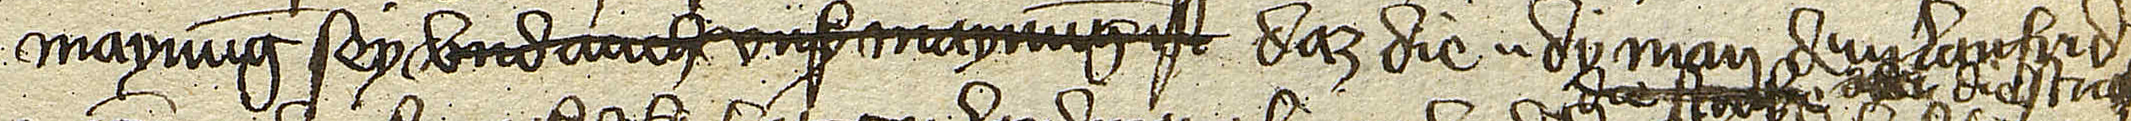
maynug* ſey / vnd auch vnſ* maynug* iſt daʒ die ~ dy man dem lanfrid
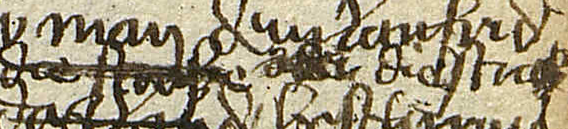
die ſtraſʒe oder die ſtraſʒ
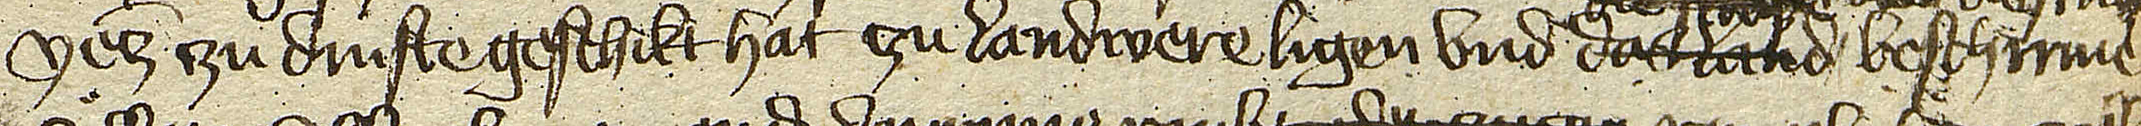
yecʒ* cʒu dinſte geſchikt hat cʒu landwere ligen vnd das land beſchirme*
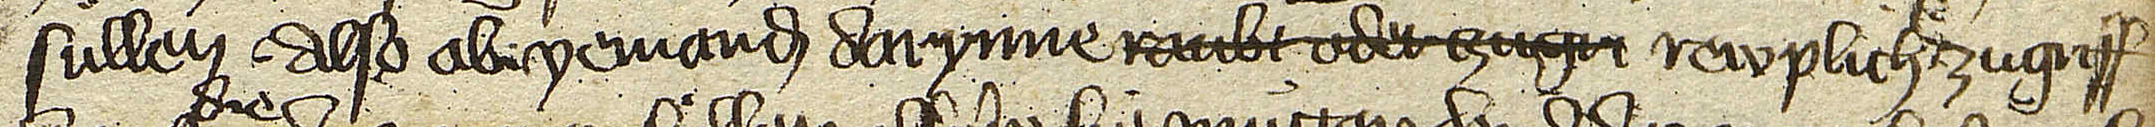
ſüllen / Alſo ob yemand darynne raubt oder cʒugri rewplich cʒugriff
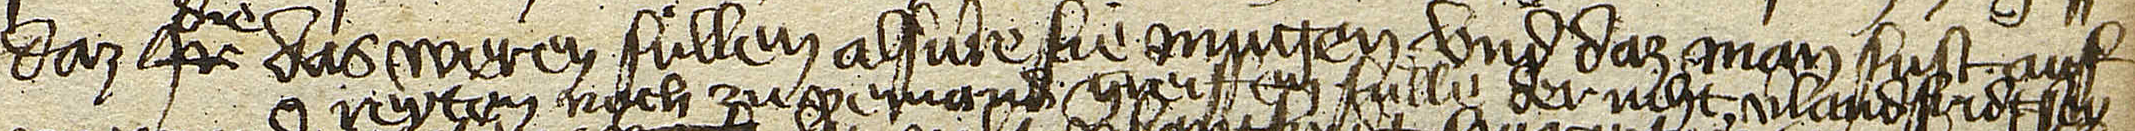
daʒ Ir das weren ſüllen alſu*re ſie mügen / vnd daʒ man ſuſt auf
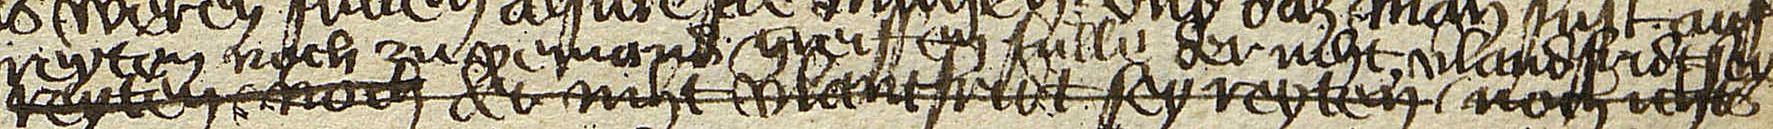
reyten noch ʒu yemand greiffen ſülle der niht v*landfridt ſey
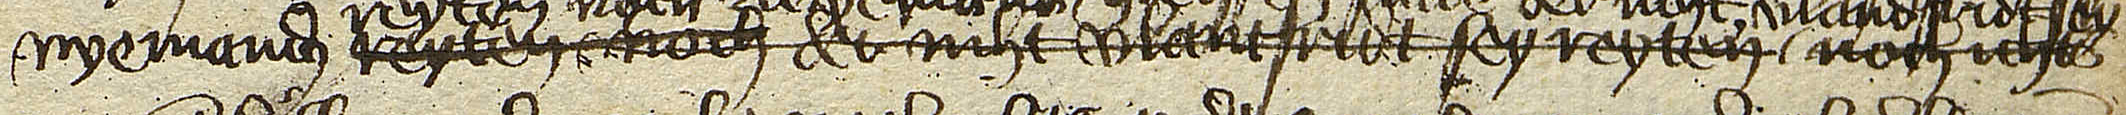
nyemand* reyten / noch der niht v*landfridt ſey reyten / noch ichts
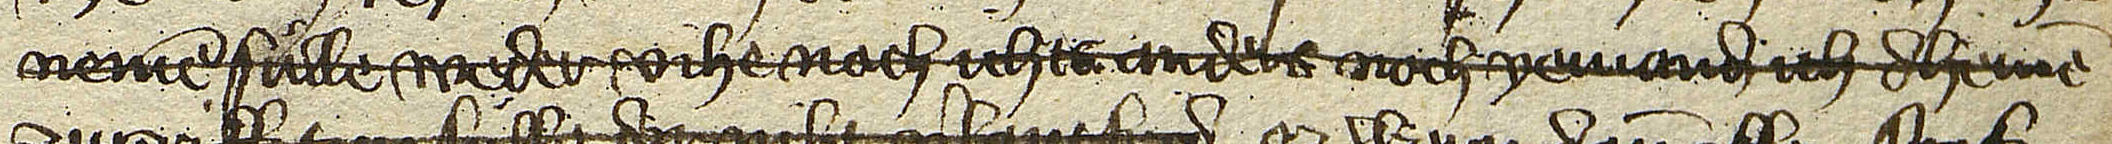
neme* ſülle weder vihe noch ichts anders noch yemand* ich dheine*
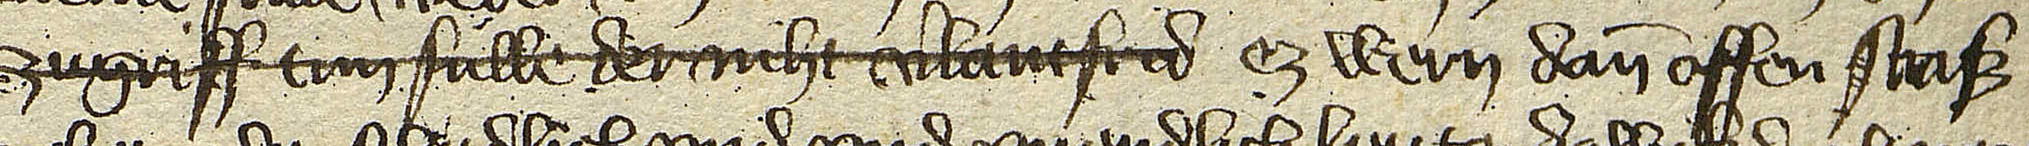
cʒugriff tun ſülle der niht v*lantfried eʒ wern dan* offen ſtraſʒ
